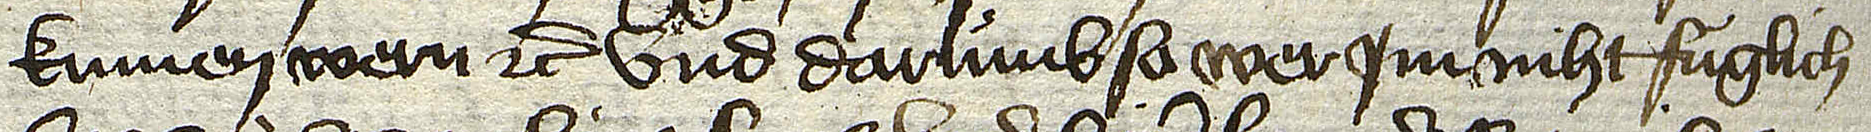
kumen wern ec* Vnd darümb ſo wer Im niht füglich
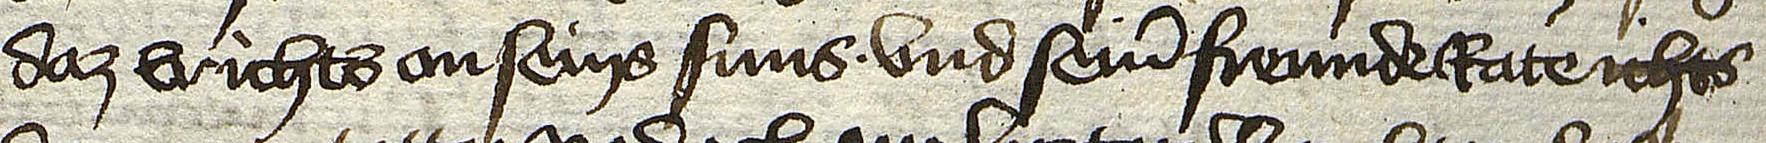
daʒ Er ichts an ſeins ſuns . Vnd ſein* freunde Rate ichts
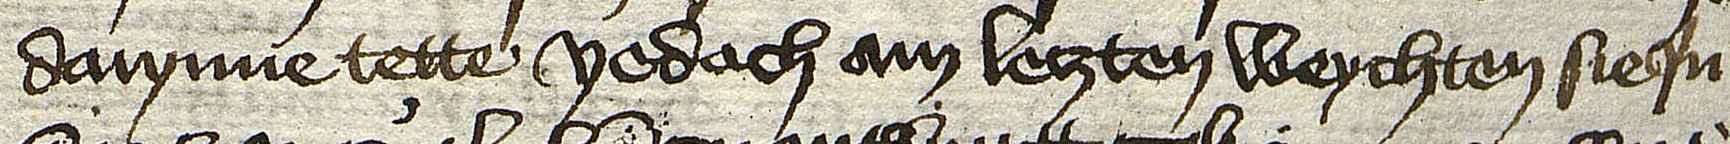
darynne tette . Yedoch am lecʒten weychten ſie In
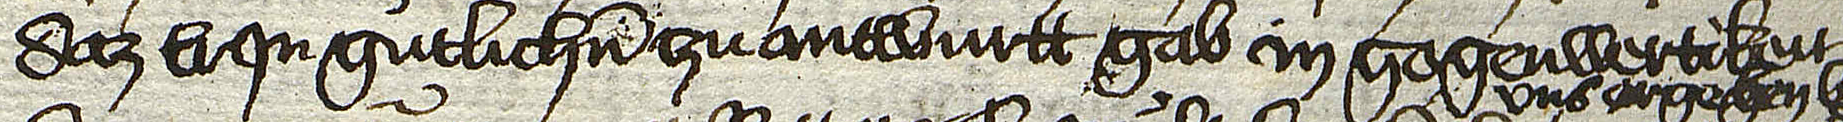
daʒ Er In gütlich*n cʒu antwurtt gab im gegenwertikeit
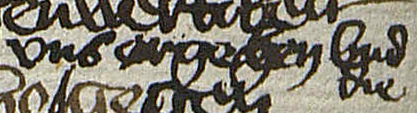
vns ergegen vnd
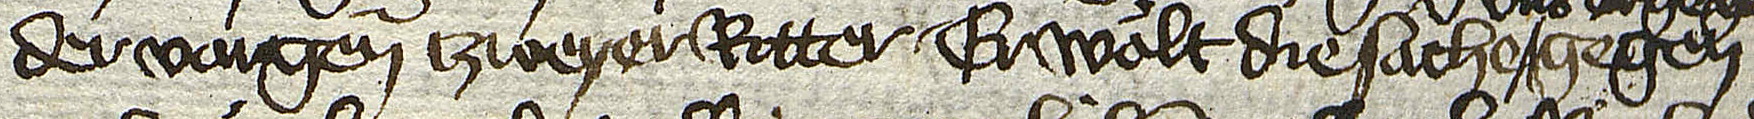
der vorgen* cʒweyer Ritter / Er wölt die ſache gegen
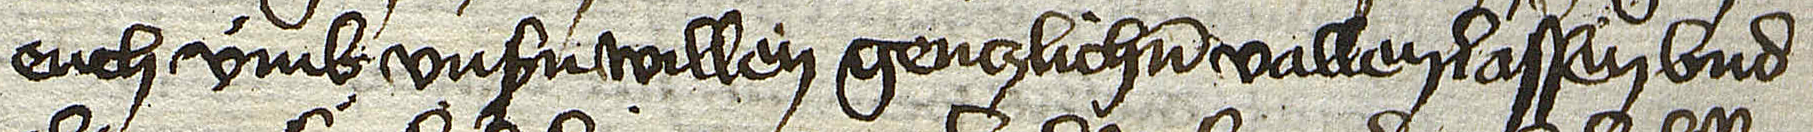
euch v̈mb vnſ*n willen gencʒlich*n vallen laſſen vnd
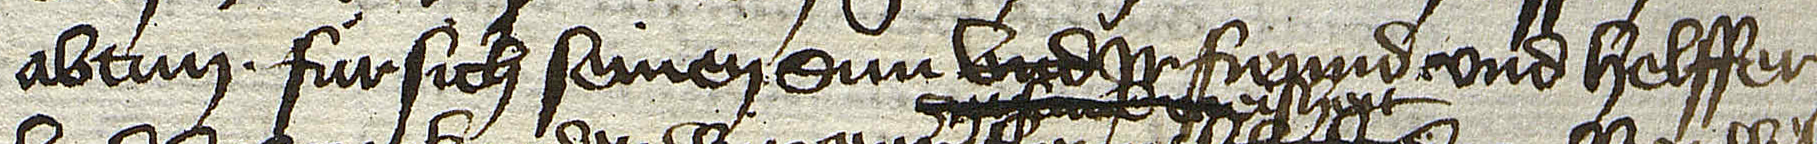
abtun . für ſich ſeinen Sun Vnd Ir freund vnd helffer
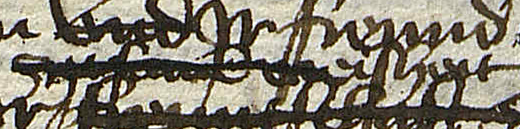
%% erſame* weiſheit
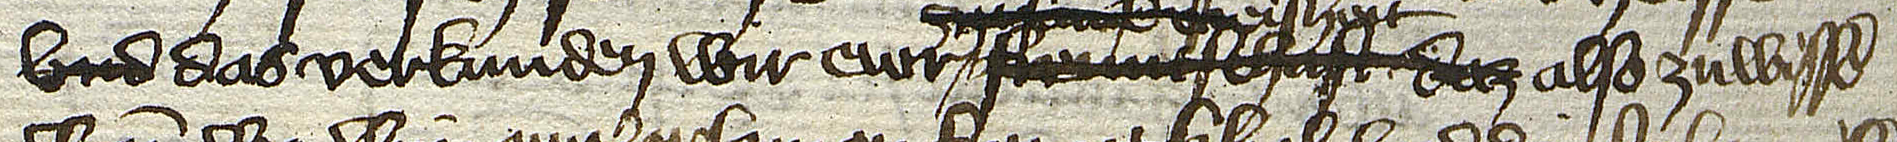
Vnd das verkunden wir ewr freuntſchaftl* daʒ alſo ʒu wiſſe*
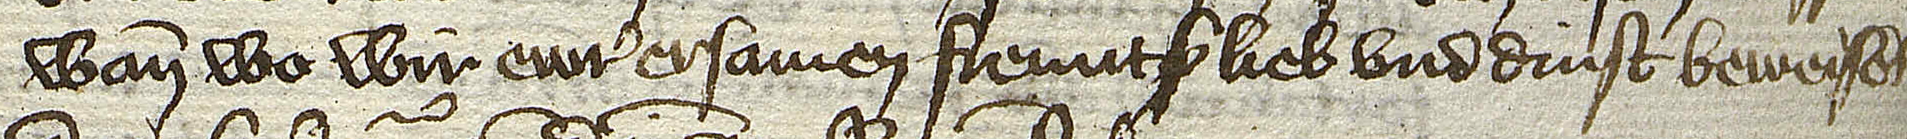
wan* wo wir ewr* erſamen freuntſ* lieb vnd dinſt beweiſe* ec*
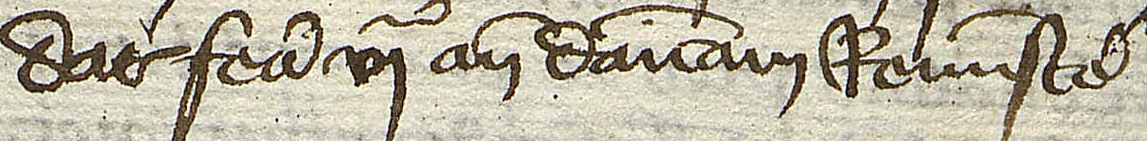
Dat* fe*a vi* an* doicam* Remiſce*
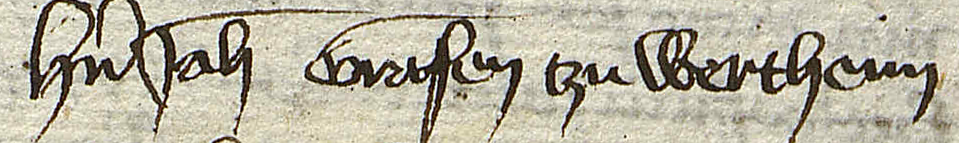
h*n Ioh* Grafen cʒu Wertheim
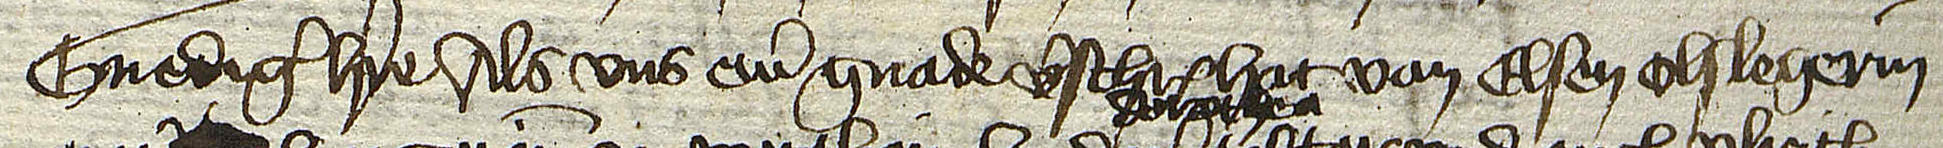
Gnedig* h*re Als vns ew* gnade v*ſchr* hat von Elſen Olſlegerin*
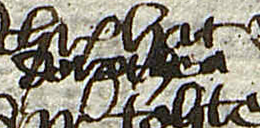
dorothea
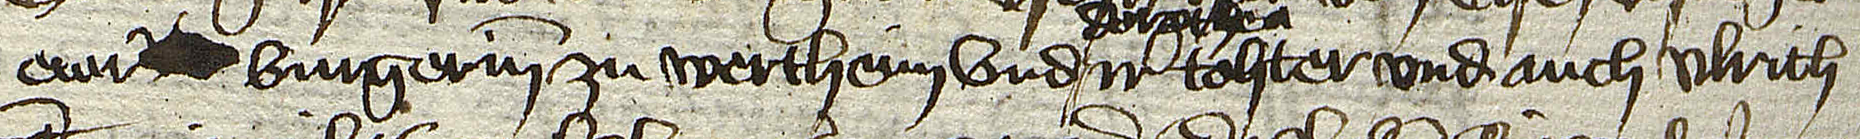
ewr* burgerin* ʒu wertheim vnd ir* tohter vnd auch vlrich
